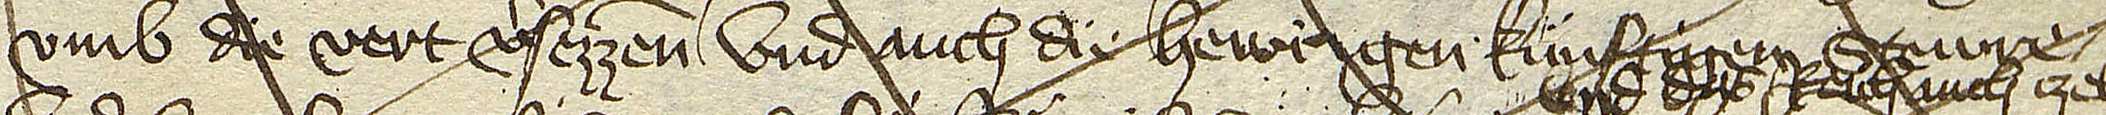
vmb die vert v*ſeʒʒen* vnd auch die hewtigen künſtigen Stewre
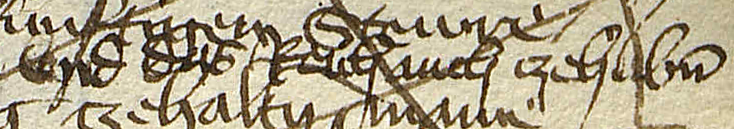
vnd das Reich auch cʒehabn*
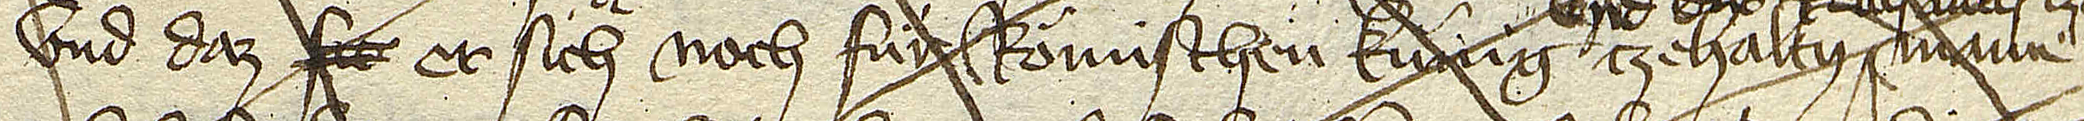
vnd daʒ ſic er ſich noch für Römiſchen künig cʒehaltn* maine
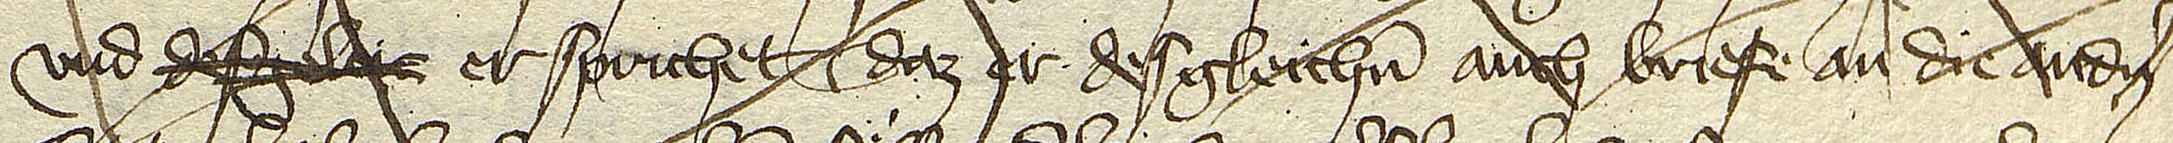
vnd deſgeleis er ſprichet / daʒ er deſgleichn* auch briefe an die andn*
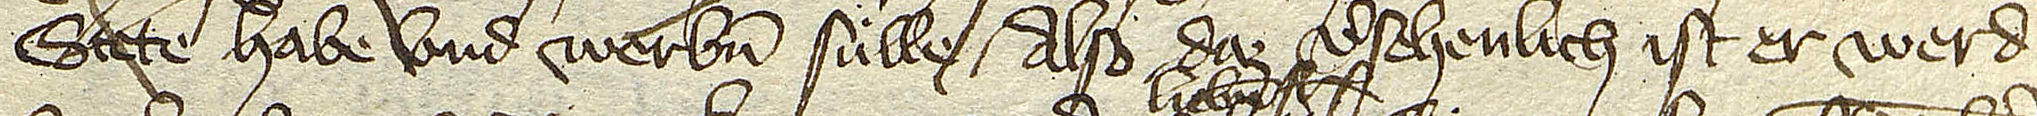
Stete habe vnd werbn* ſülle / Alſo daʒ v*ſehenlich iſt er werd
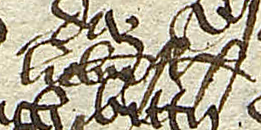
liebn* fr*
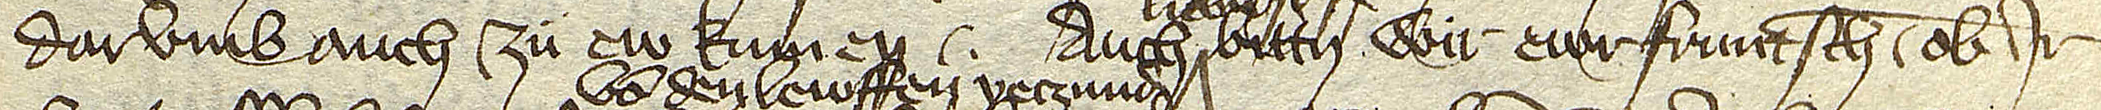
darvmb auch cʒü ew kumen / . Auch bittn* wir ewr fruntſch* / ob Ir
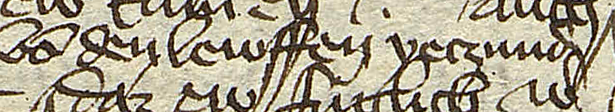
vo* den lewffen yecʒund*
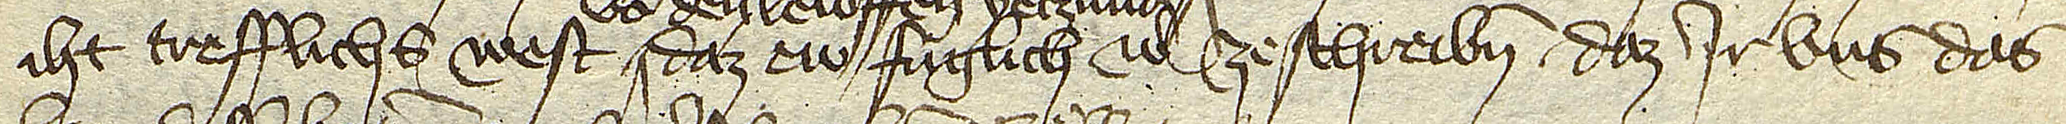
iht trefflichs weſt / daʒ ew fuglich w* cʒeſchreibn* / daʒ Ir vns das
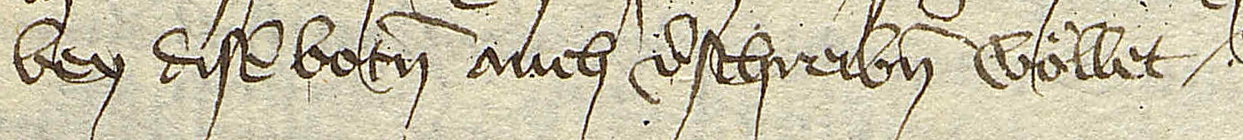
bey diſe* botn* auch v*ſchreibn* wöllet /
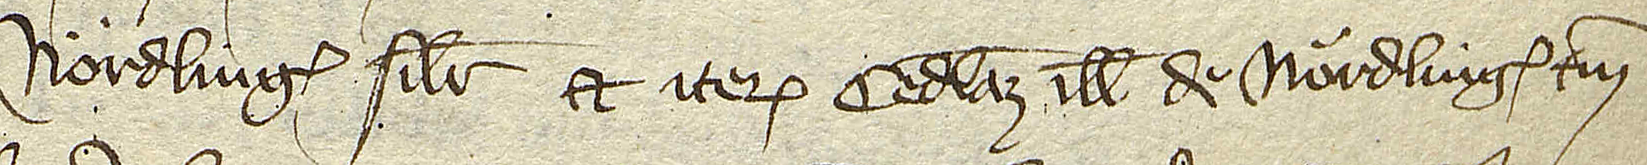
Nördling* ſilr* et ite* Cedlaʒ ill* d* Nördling* %%*
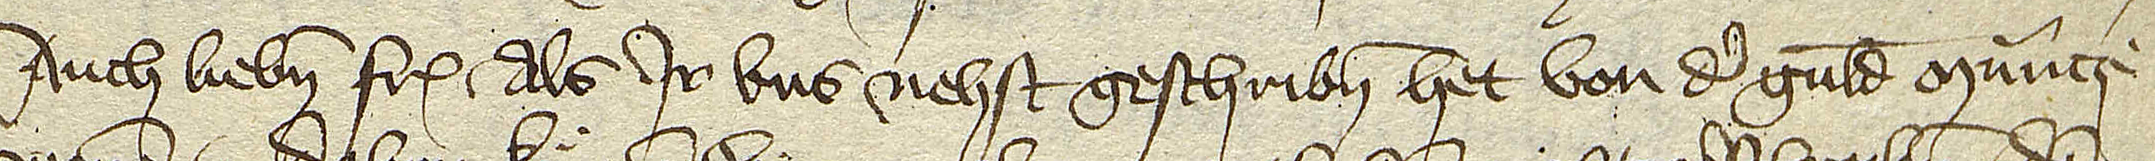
Auch liebn* fr* / Als Ir vns nehſt geſchribn* het von d* guld* Müncʒe
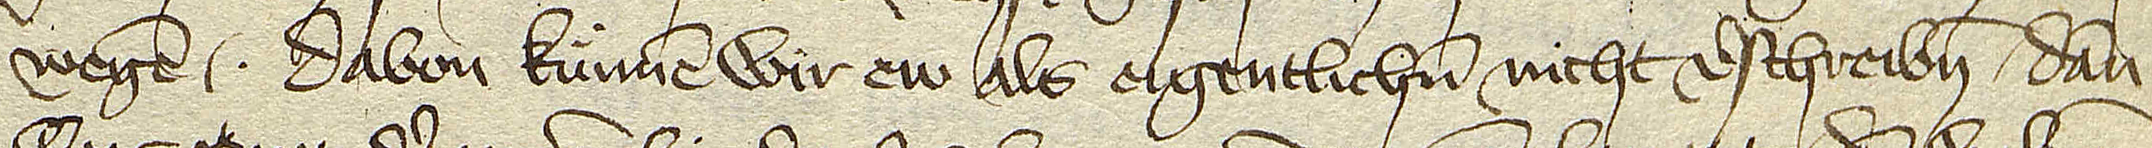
wege* / . davon künne* wir ew als eigentlichn* nicht v*ſchreibn* / dan*
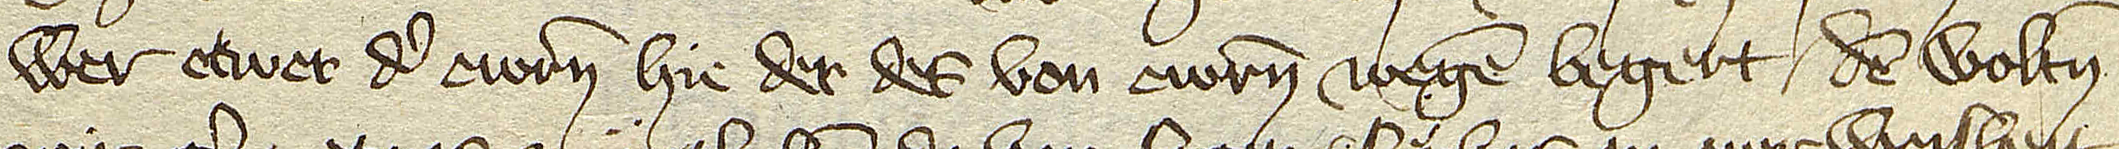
wer etwer d* ewr*n hie der des von ewrn* wege* begert / de* woltn*
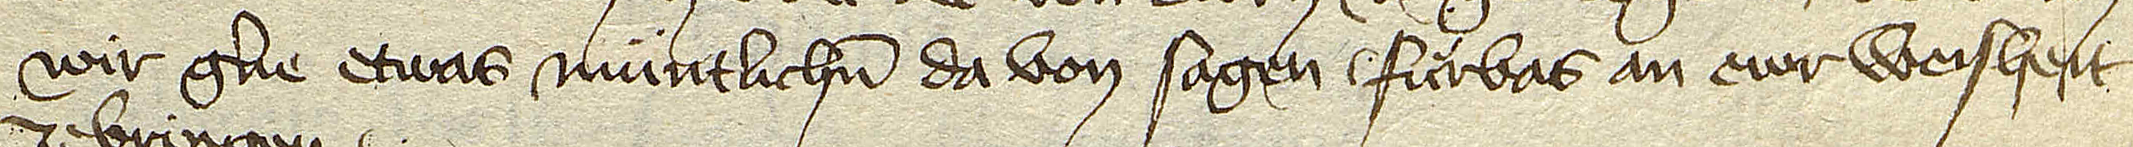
wir g*ne etwas müntlichn* da von ſagen / fürbas an ewr weiſheit
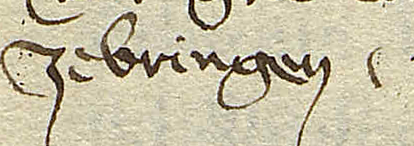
cʒebringen /
